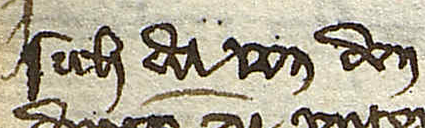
ſich da von den
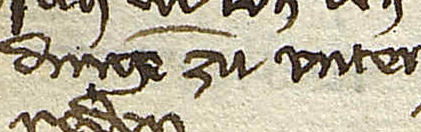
dinge* ʒu vnter
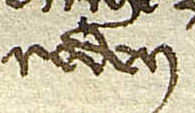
reden
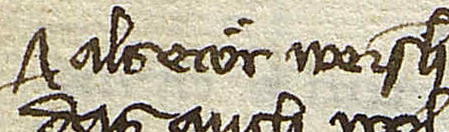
als ewr weiſh*
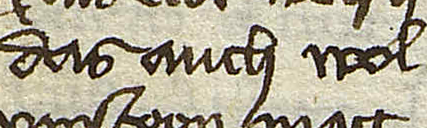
das auch wol
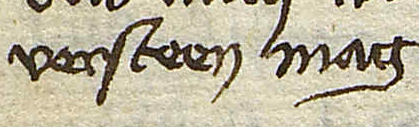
verſteen mag
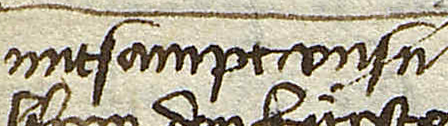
mitſampt vnſ*n
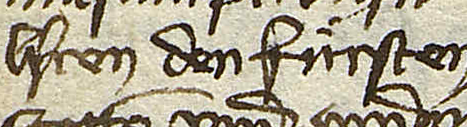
h*ren den fürſten
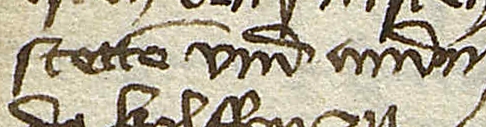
ſtette* vnd andn*
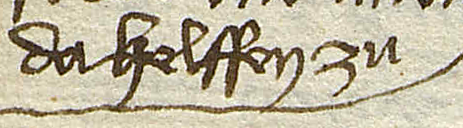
da helffen ʒu
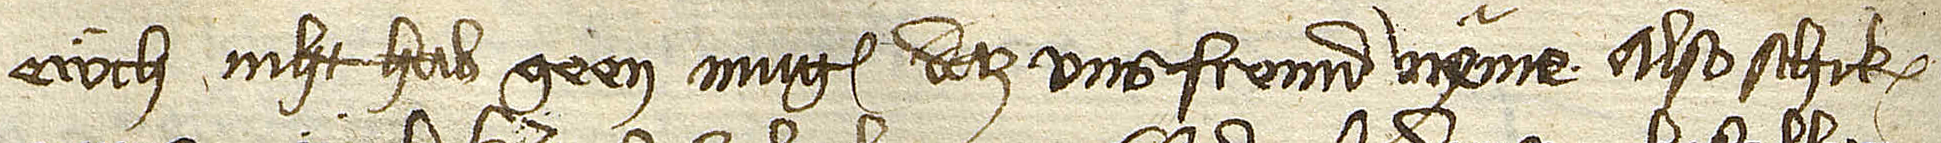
ewch niht hab geen mug* daʒ vns fremd nëme . Alſo ſchik*
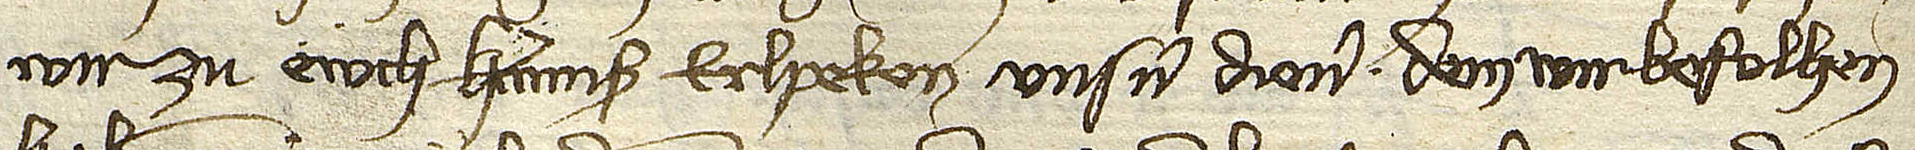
wir ʒu ewch hannſ* Erlpeken vnſ*n dien* . dem wir befolhen
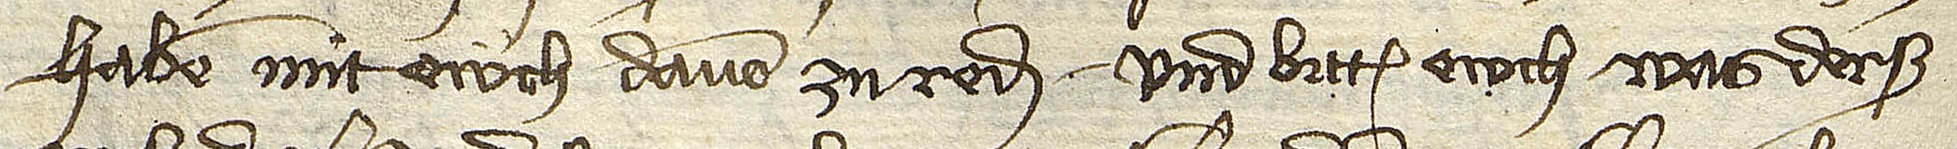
habe* mit ewch dauo* ʒu red* / vnd bitt* ewch was derſ*
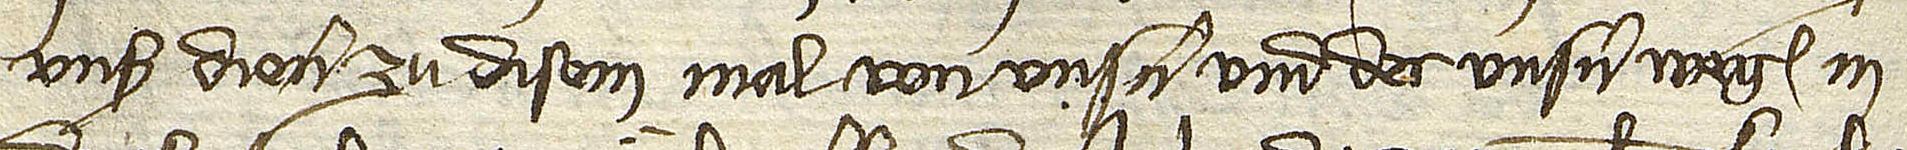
vnſ* dien* ʒu diſem mal von vnſ*n vnd der vnſ*n weg* in
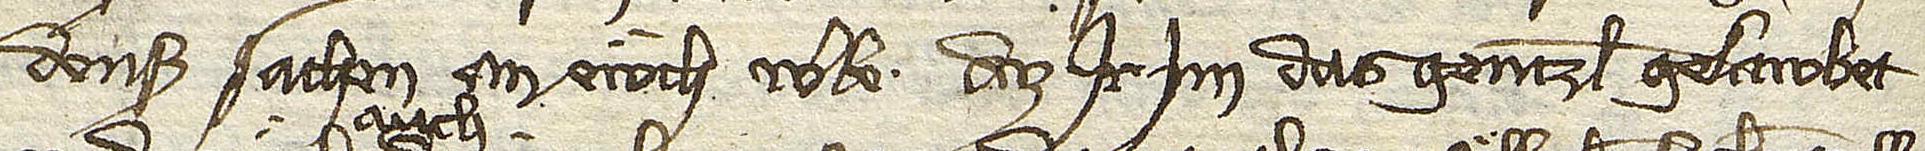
denſ* ſachen an ewch w*be . daʒ Ir Im das gencʒl* gelawbet
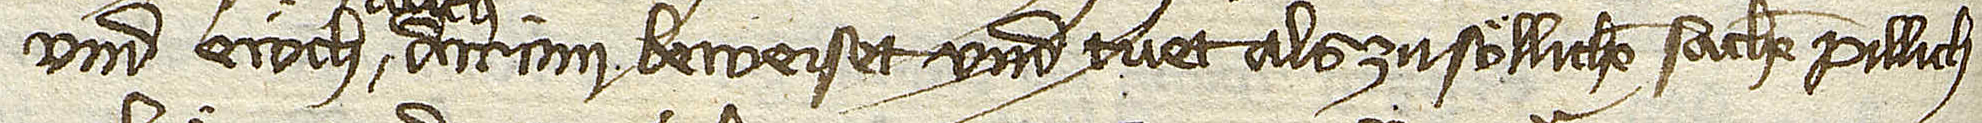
vnd ewch darinn beweiſet vnd tuet als ʒu ſölliche* ſache* pillich
